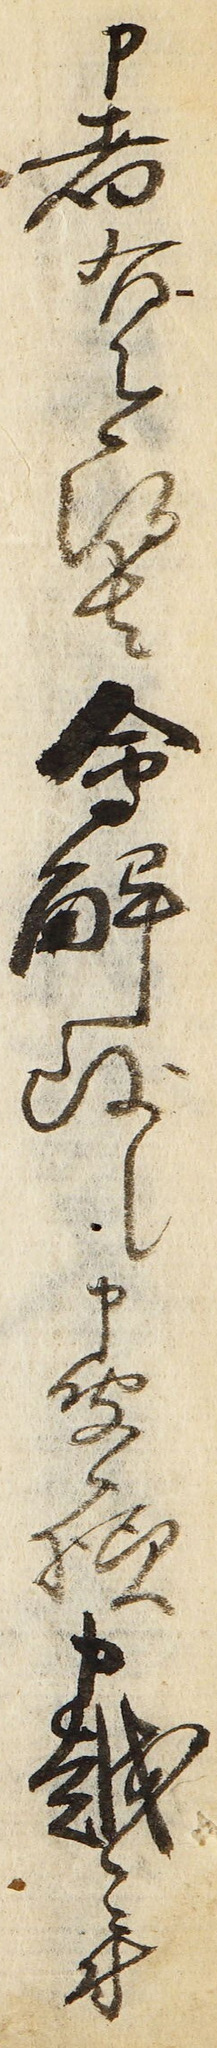申者有之候得は会解致し申聞候様申越候に付
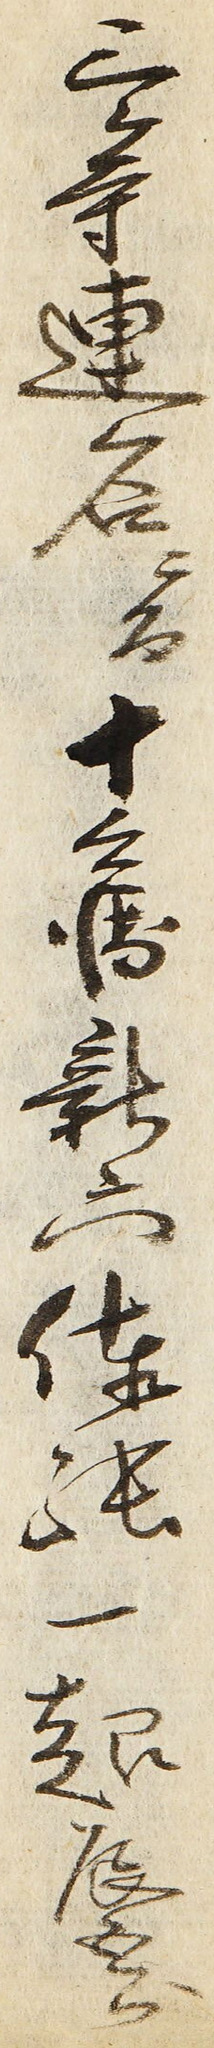三ケ寺連名に而十兵衛新六俸張一超辰五郎
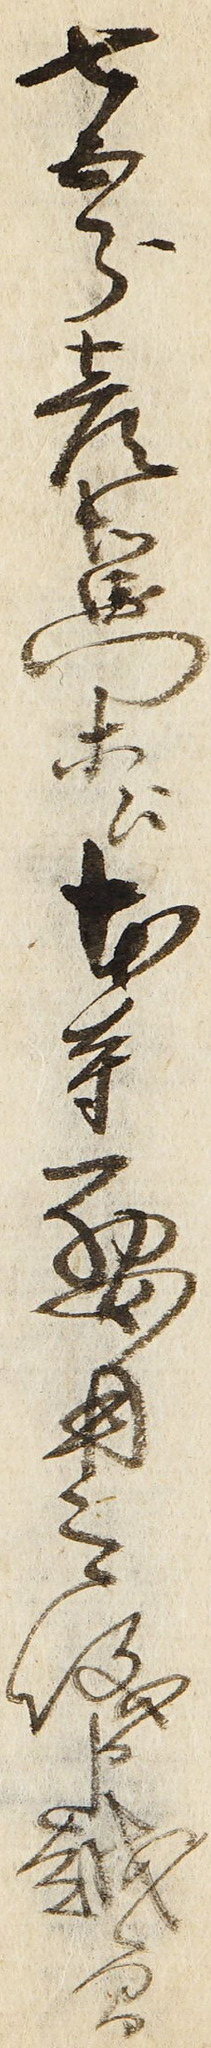七五郎彦左衛門等江本寺要用之儀申越候間
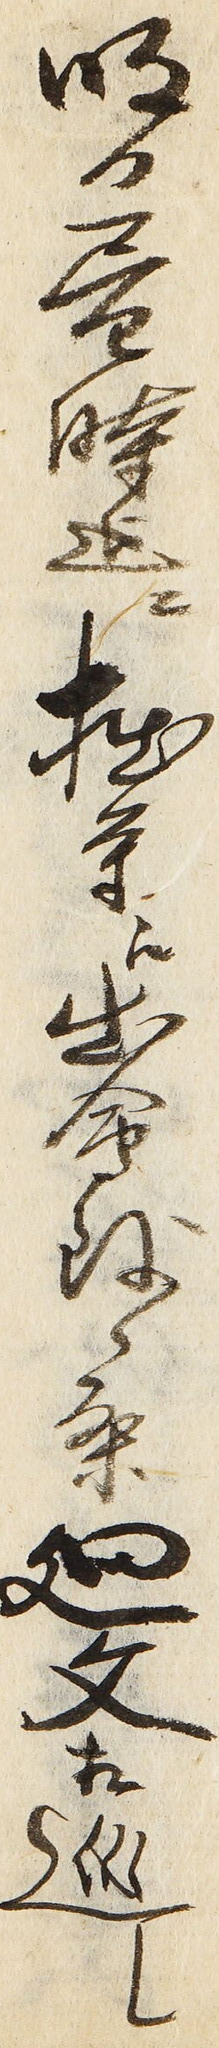明日昼時迠に拙寺江出令致候条廻文相巡し
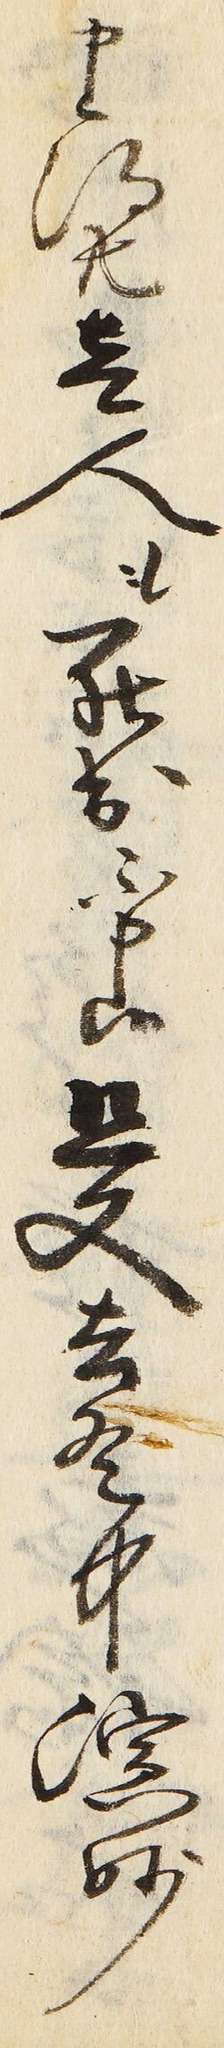申候得共壱人も罷出不申候且又去冬中演妙
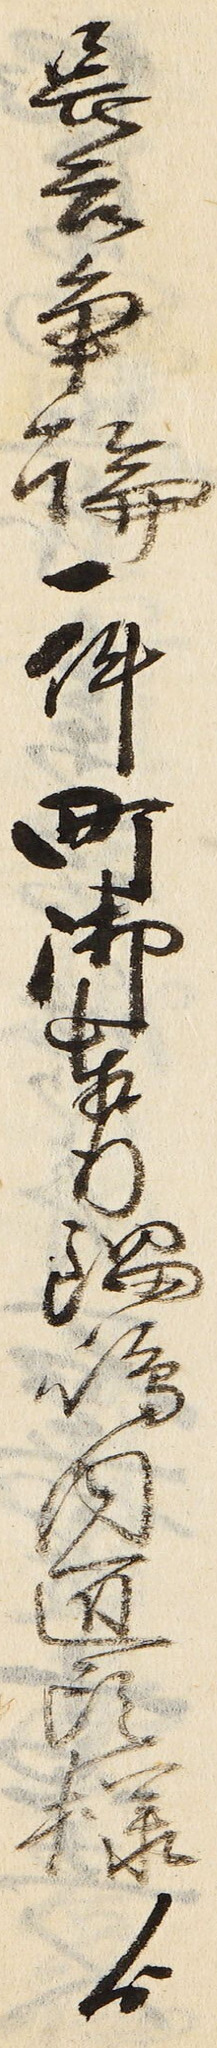長吉争論一件町御奉行鍋嶋内匠頭様ゟ
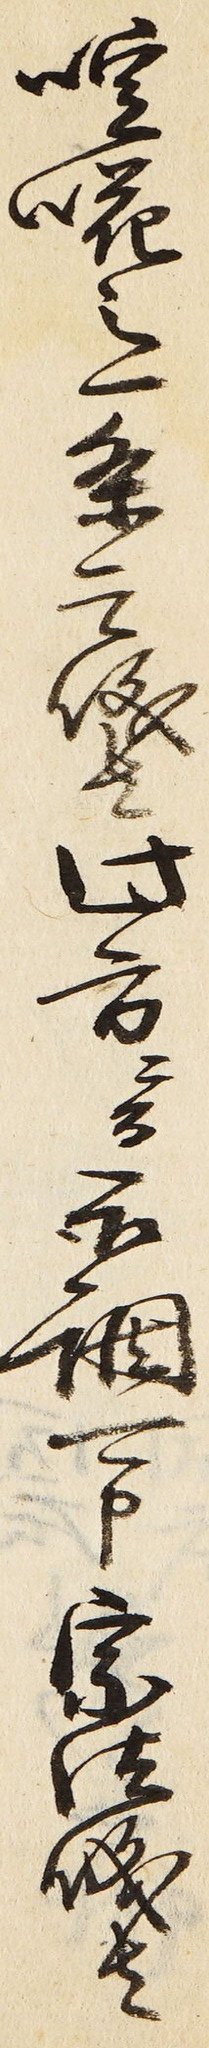喧嘩之一条之儀は此方に而取調可申宗法儀は
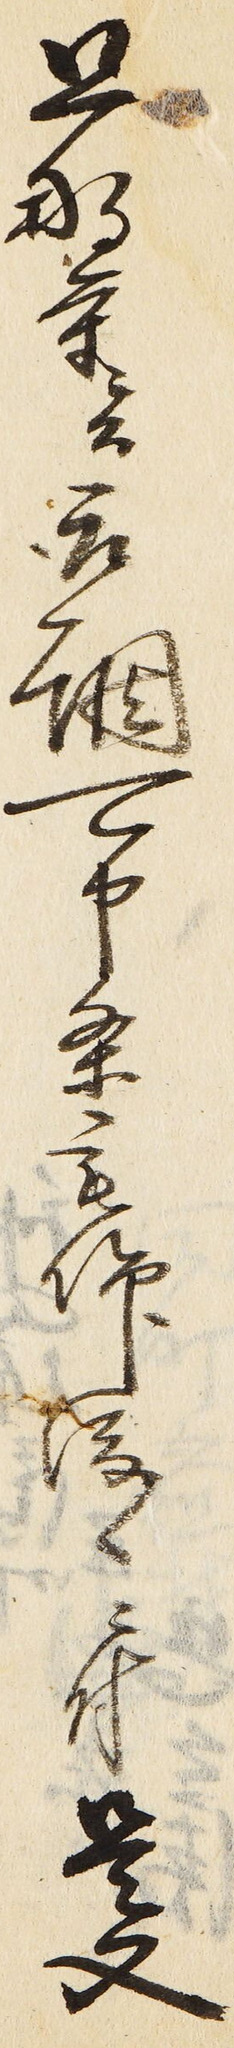旦那寺に而取調可申条も仰渡候に付是又
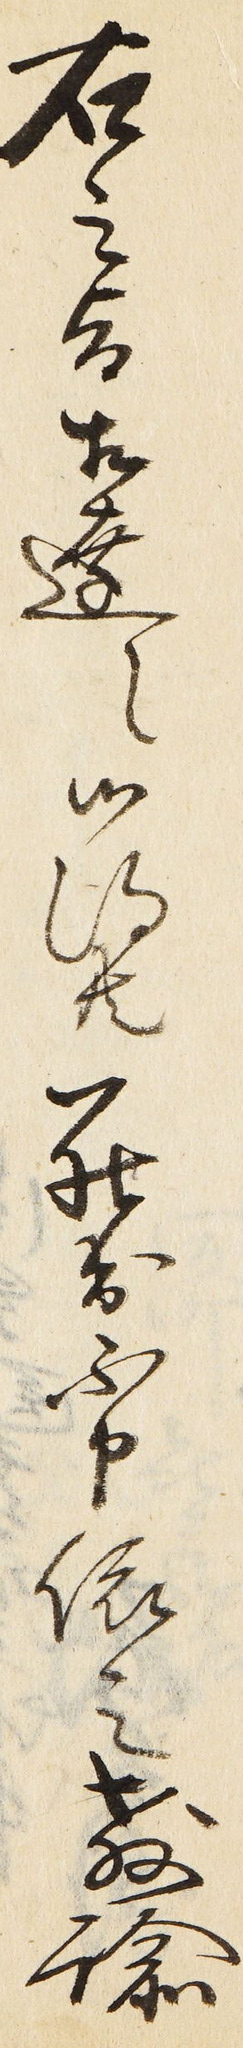右之旨相達し候得共罷出不申依之教諭
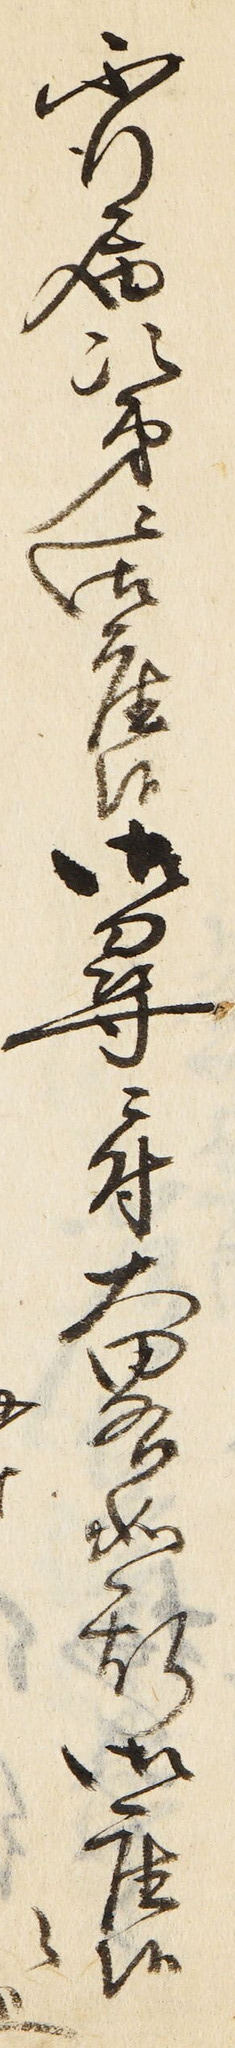不行届次第に御座候御尋に付大略如斯御座候
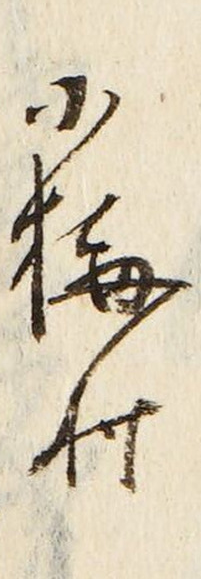小梅村
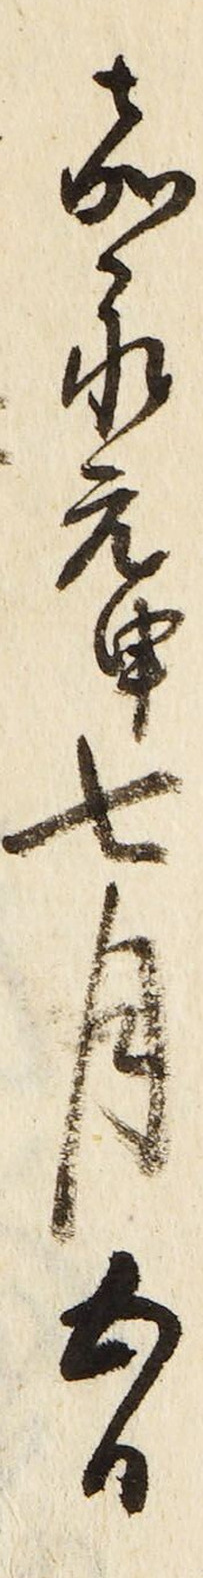嘉永元申七月五日
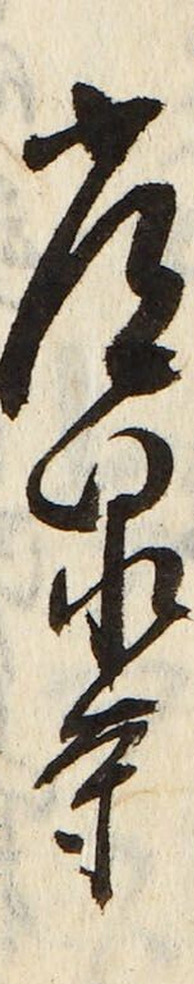常泉寺
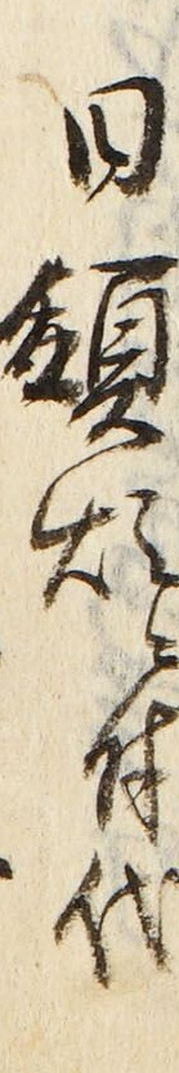日須煩に付代
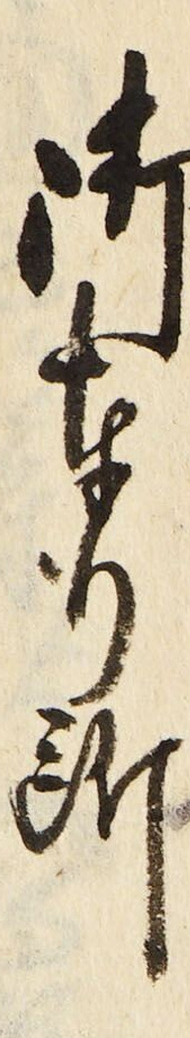御奉行所

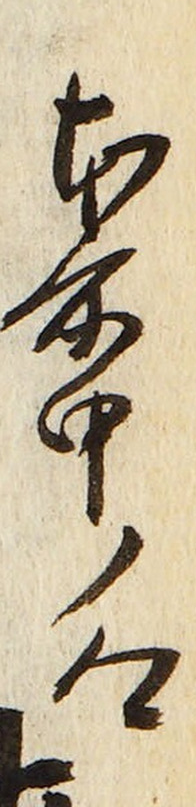本所中ノ郷
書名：異流一件日記
